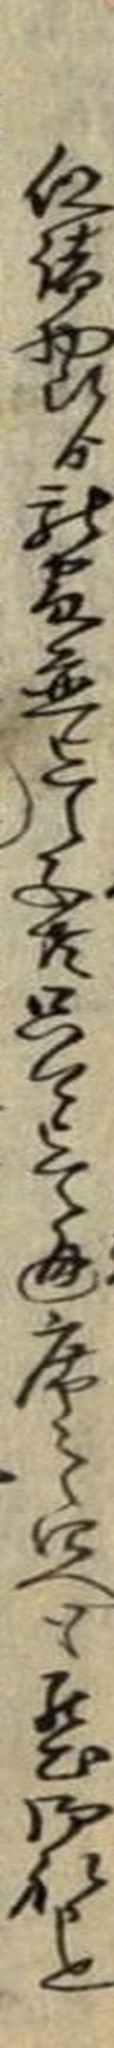但諸物頭ゟ新番並迄之子共只今迄之通席々へ四人つゝ罷出御礼申上
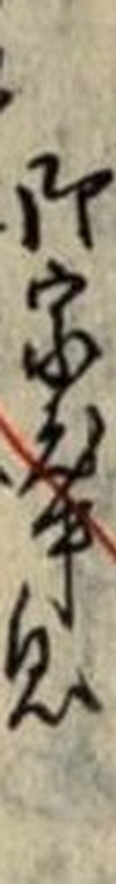御家老中息
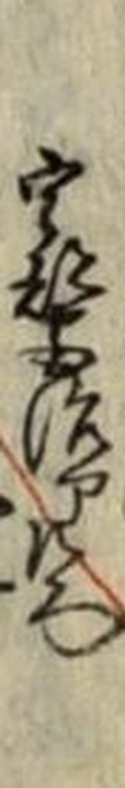宇都宮治部左衛門
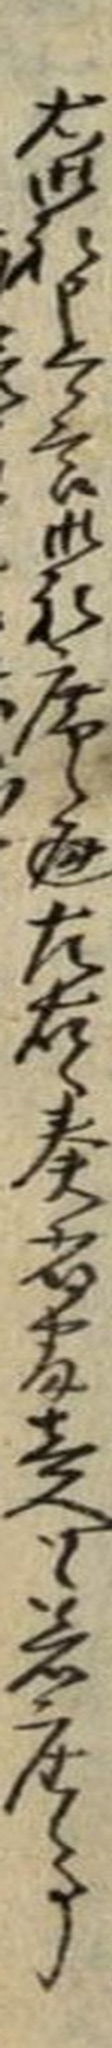右御礼申上候節御礼席之通左右へ奏者番壱人つゝ着座候事
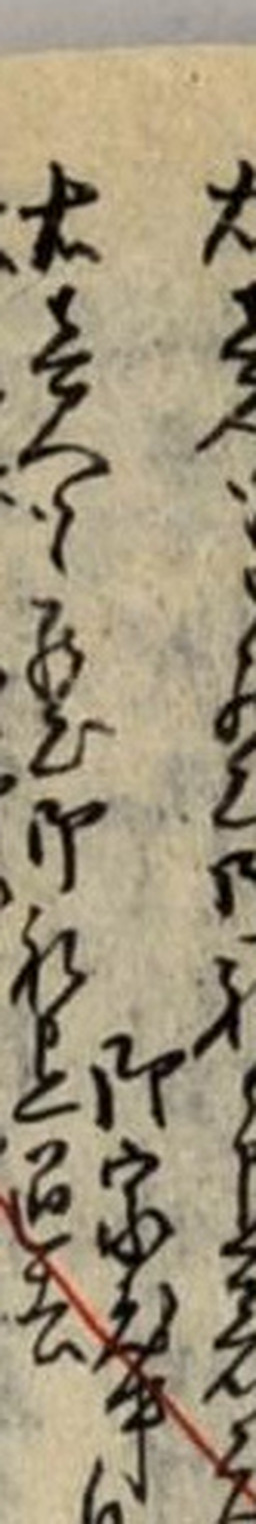右壱人つゝ罷出御祝申上退去
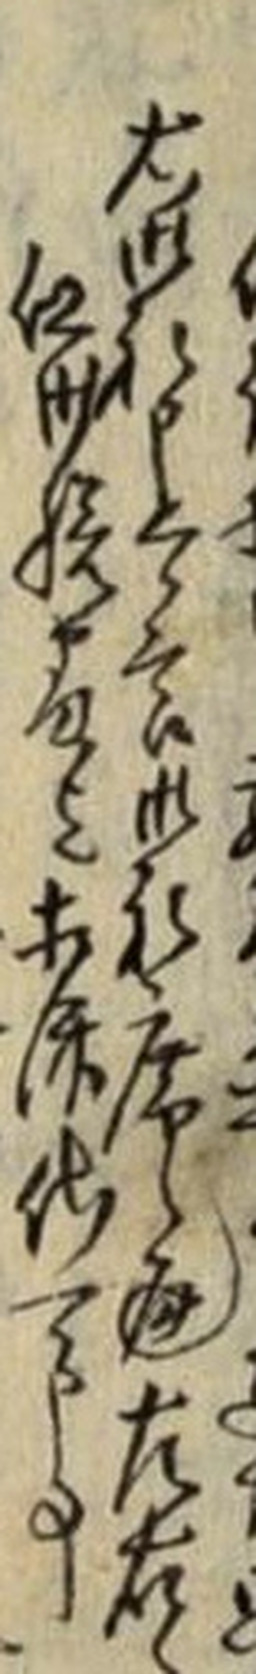但御膳番迄相済代可申候事
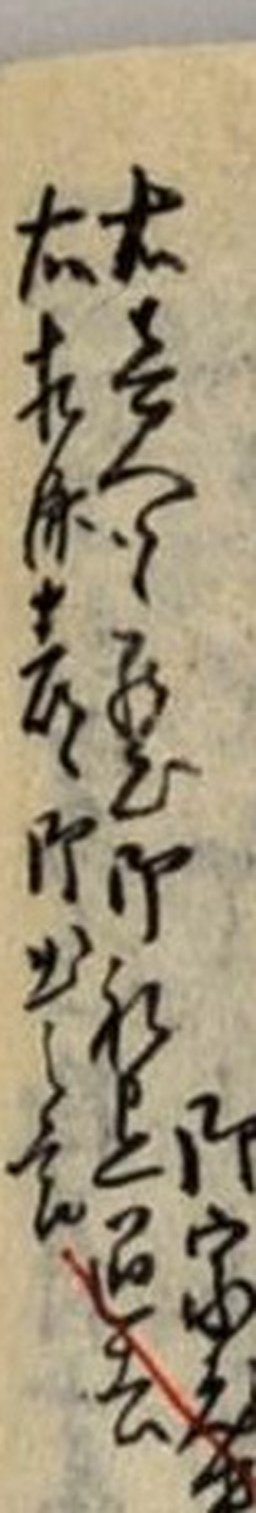右相済表へ御出之節
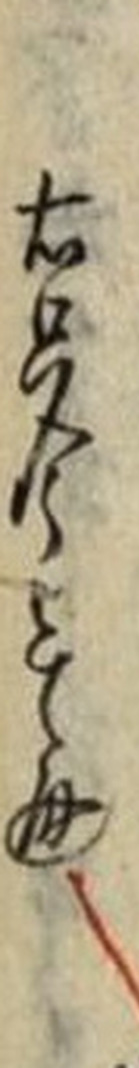右只今迄之通
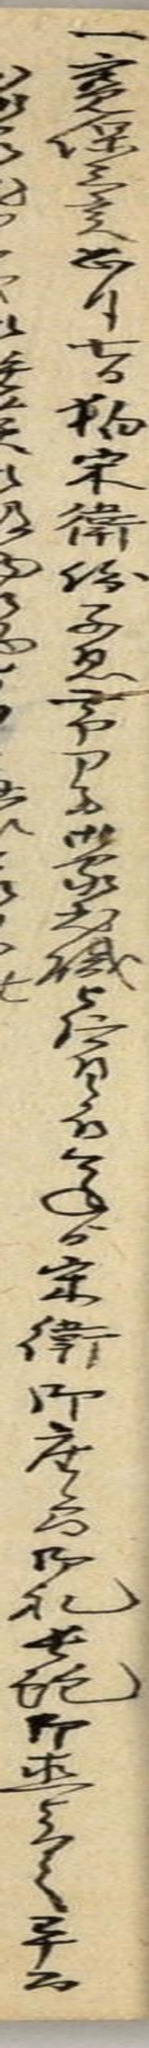一寛保三亥正月七日狛宋衛儀子息帯刀方御家老職被仰付候に付今年ゟ宋衛御座之間御礼長蚫御直々被下之畢而
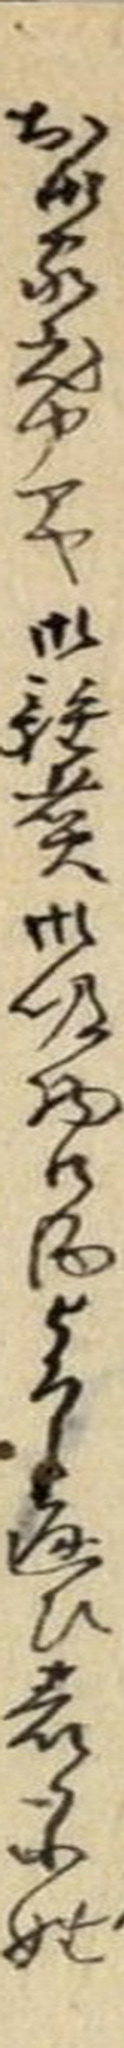於御家老中部や御雑煮御吸物御酒被下置候通次表御小姓
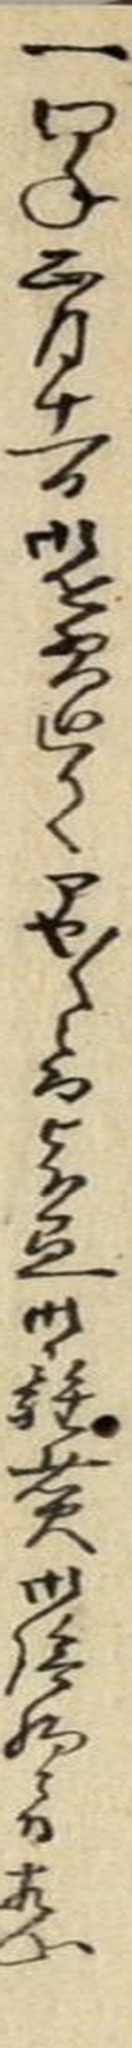一同年正月十一日御近習廻りへ部や〳〵に而被下置御雑煮御倹約に付相止
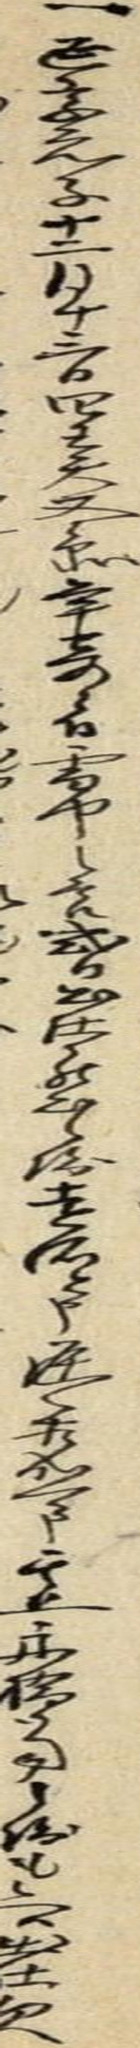一延享元子十二月十三日四王天又兵衛年寄に付雪中之節式日出仕罷出候儀遠所と申遅く相成可申其上舟橋御用之儀も候へは出仕欠
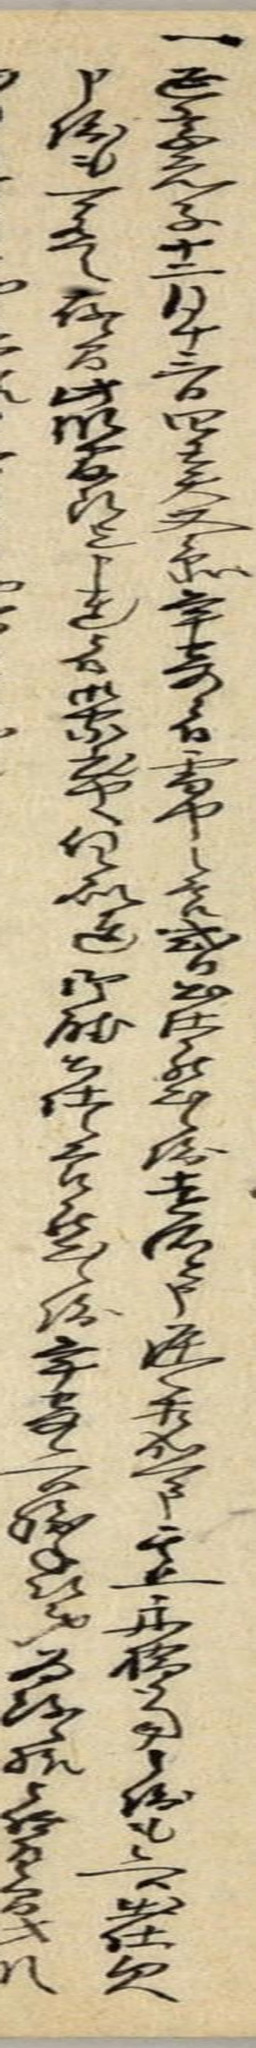申儀も可有之存候間此段番頭迄申達候に付御家老中へ伺候処達御聴出仕之節罷出候儀年寄候へは勝手次第為致候様被仰付候間此段
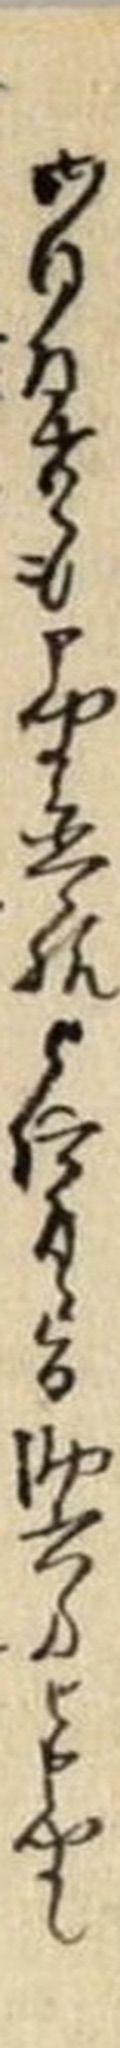御目付共へも申聞置候様被仰付候旨助六方被申聞候
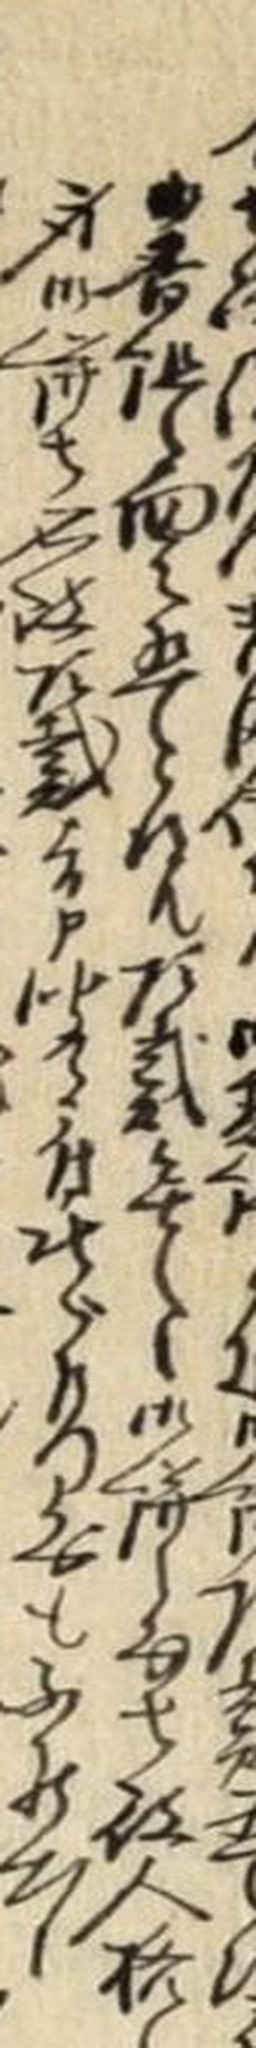身御餅は不致頂戴旨申聞候に付次郎左衛門義も不罷出候
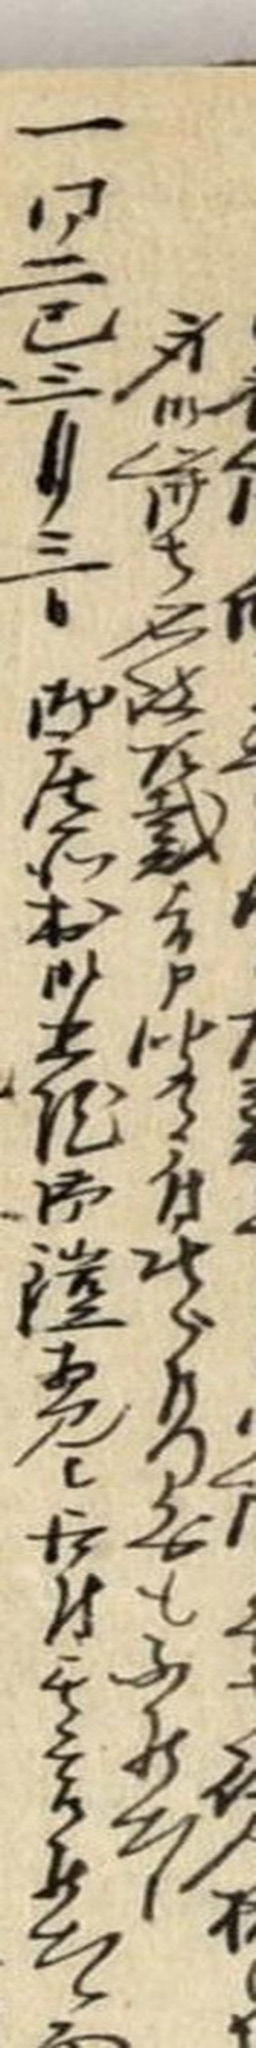一同二巳三月三日御座所於御書院御鎧拝見被仰付其節罷出候面々
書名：蒐輯之部
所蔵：福井県文書館 Fukui Prefectural Archives
